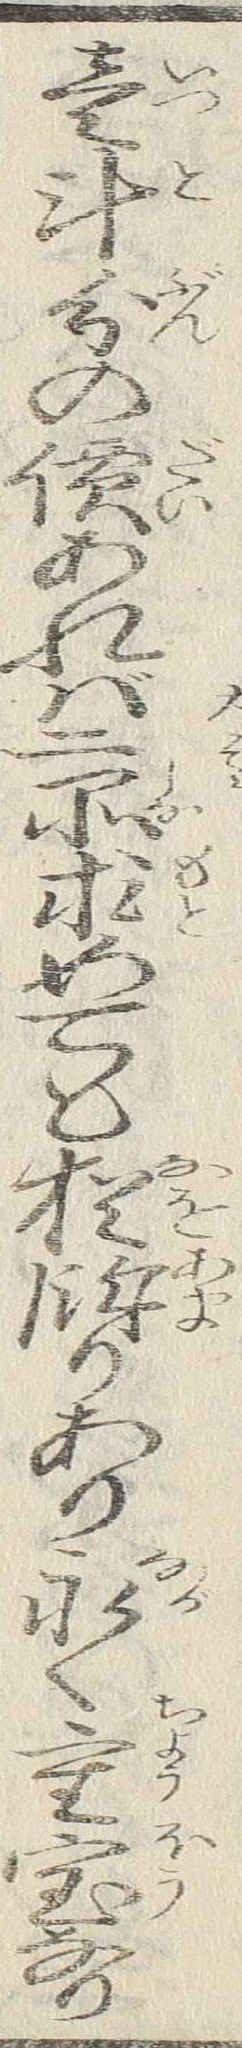壱斗分の價あれば二品求めても猶餘りあり永く重宝なり
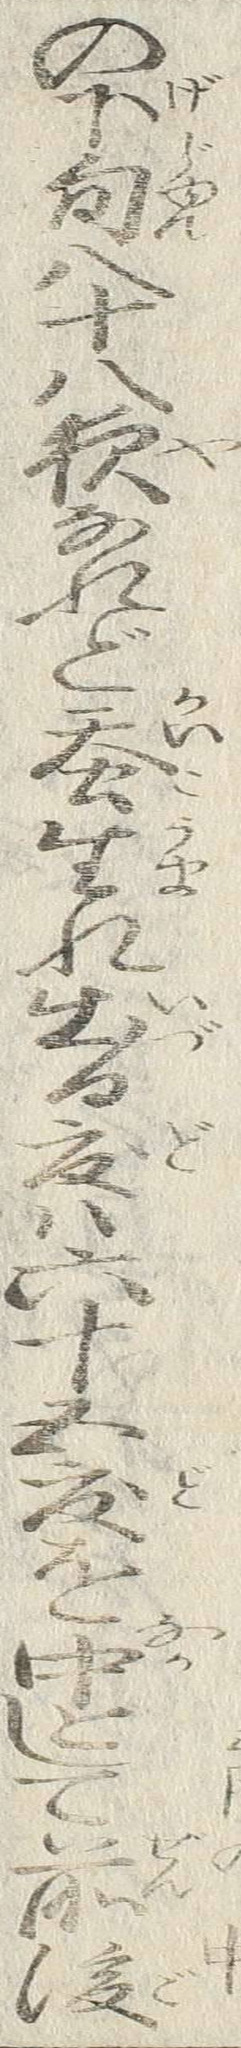の下旬八十八夜なれど蚕生れ出る度は六十五度を中として前後
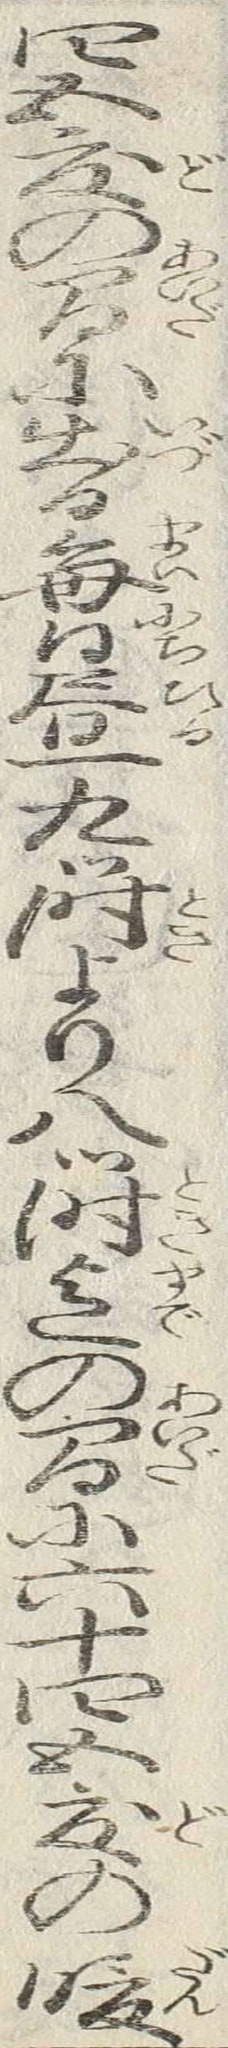四五度の間に出る毎日昼九ッ時より八ッ時迄の間に六十四五度の暖
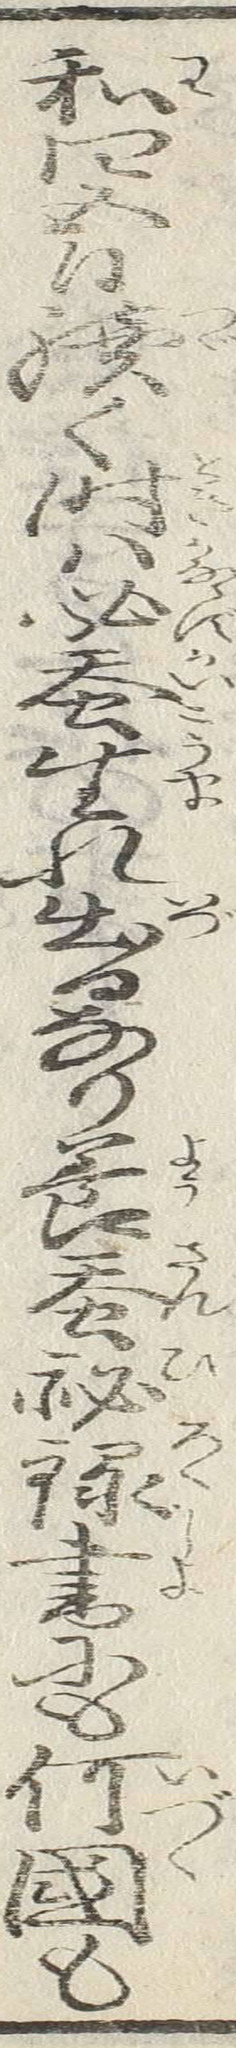和四五日続く時は必蚕生れ出るなり養蚕秘録書にも何国も
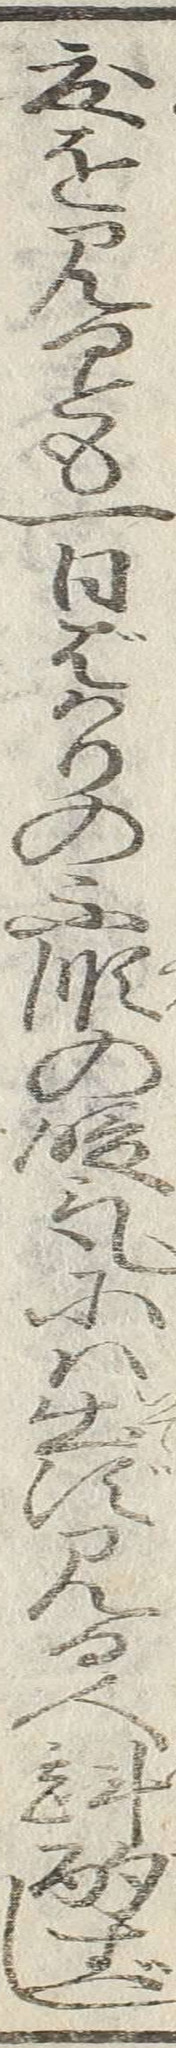度を見るとも一日ばかりのふ順の暖気には出ず見る人斟酌すべし
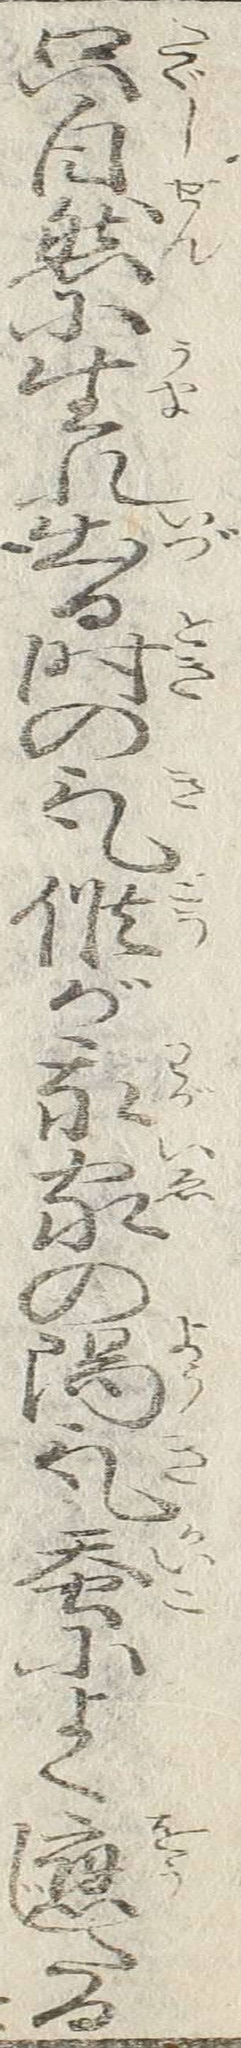只自然に生れ出る時の気候が我家の陽気蚕によく応じたると
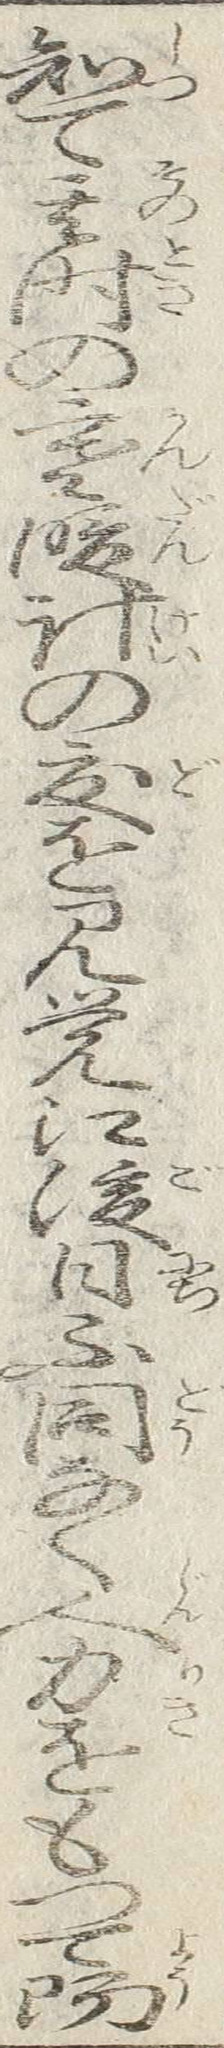知て其時の寒暖計の度を見覚え後日ふ同なく人力をもつて陽
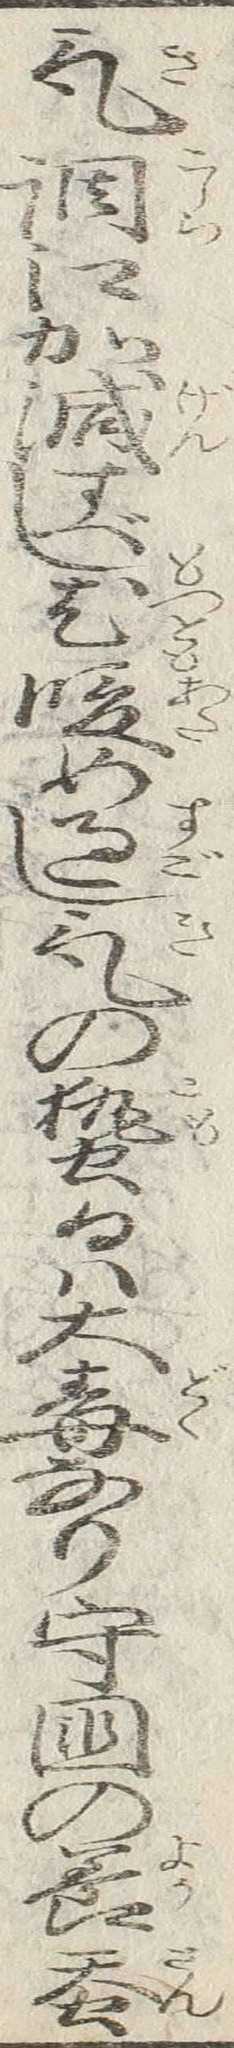気調え加減すべし尤暖め過し気の蟄るは大毒なり守国の養蚕
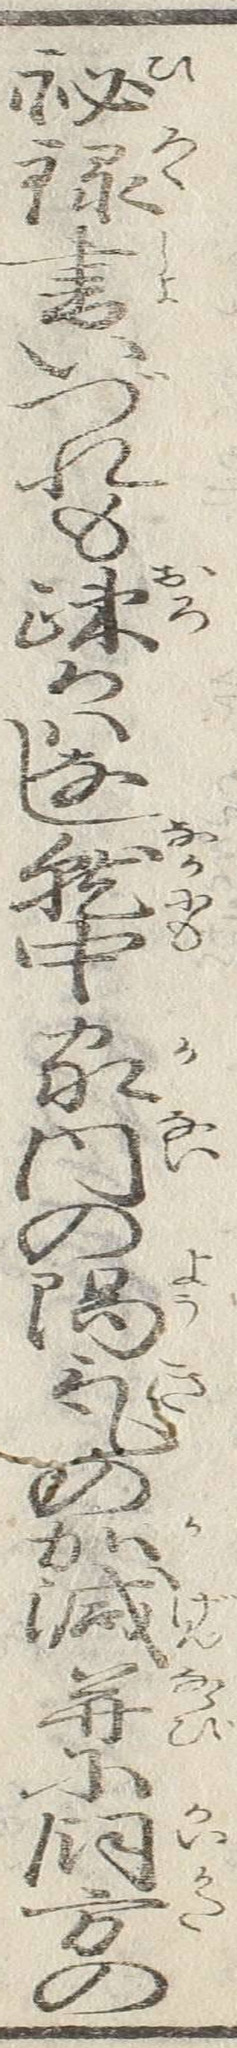秘録書いづれも疎かはなし就中家内の陽気の加減幷に飼方の
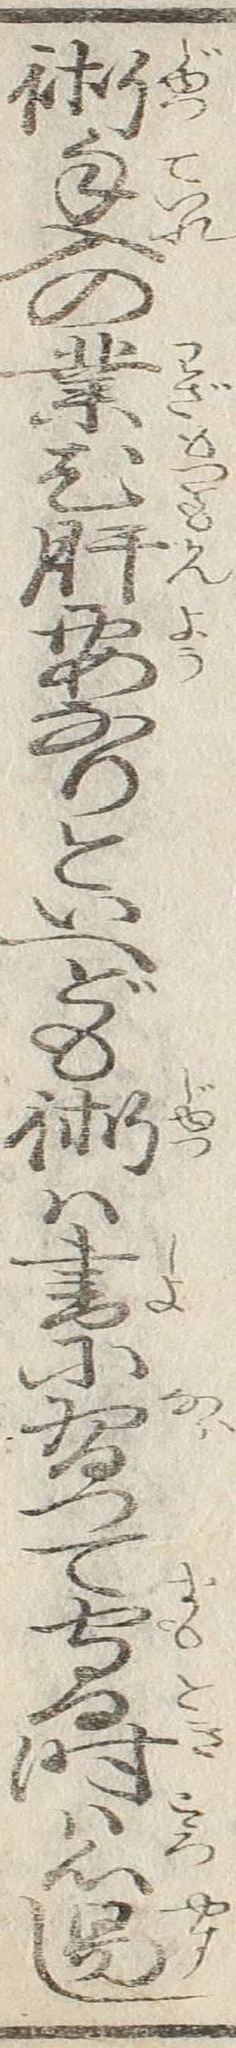術手入の業尤肝要なりといへども術は書に習つて守る時は心易し
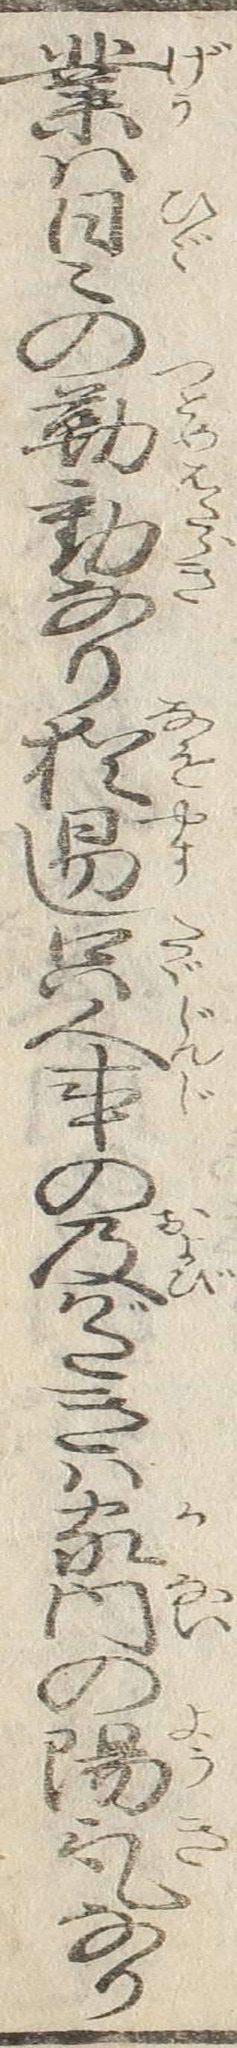業は日々の勤動なり猶易し只人事の及がたきは家内の陽気なり

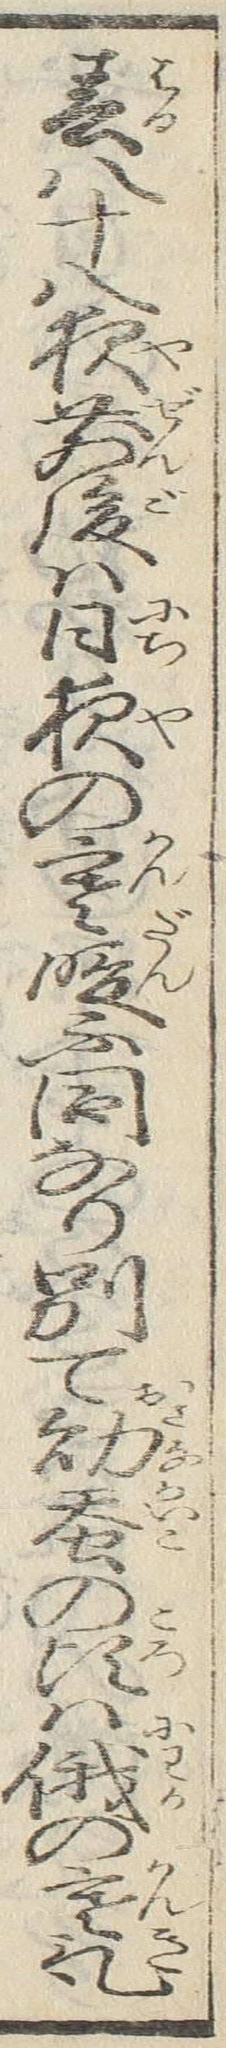春八十八夜前後は日夜の寒暖ふ同なり別て幼蚕の頃は俄の寒気
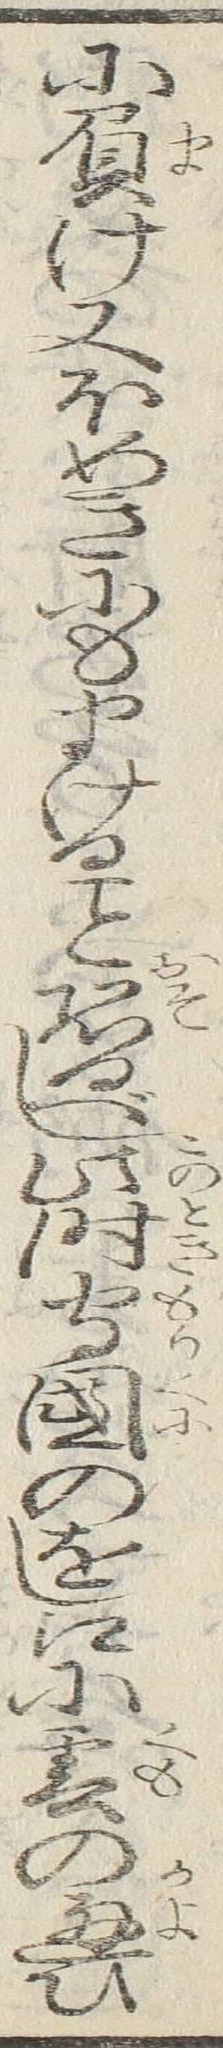に負け又ほめきにもまけること恐るべし此時守国のをしえに雲の通ひ
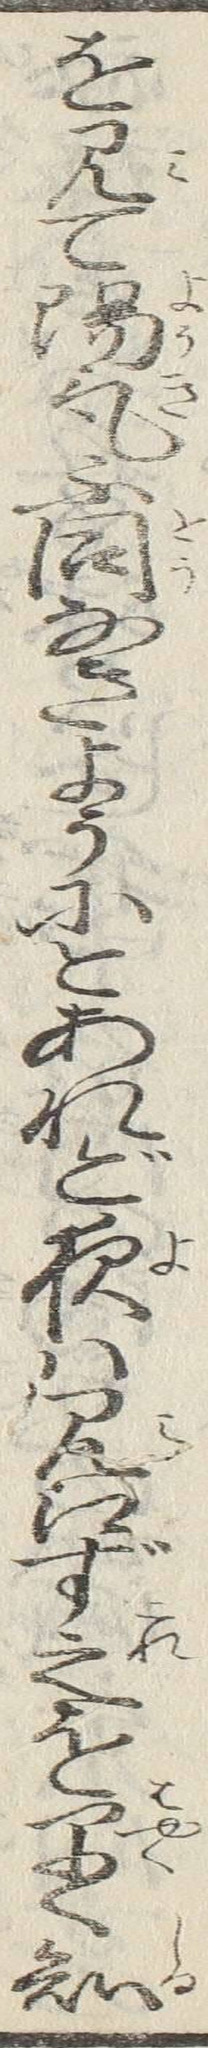を見て陽気ふ同なきようにとあれど夜は見えず之を早く知
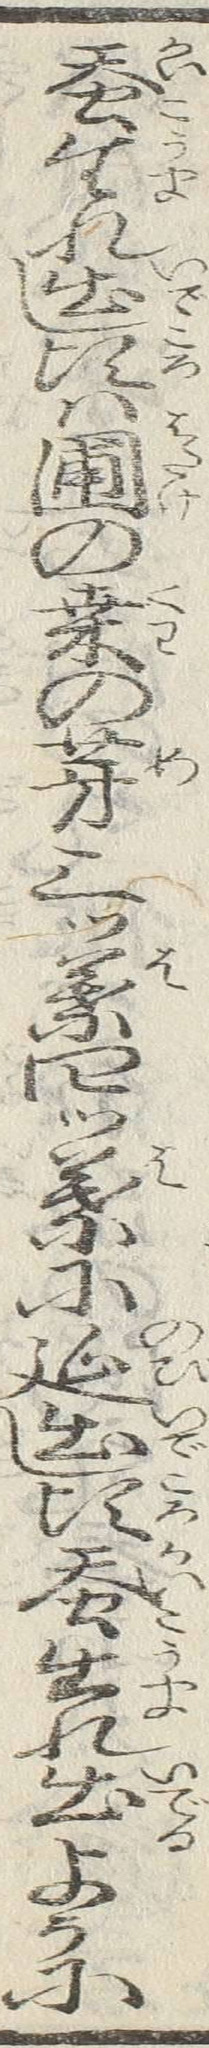蚕生れ出し頃は圃の桒の芽三ッ葉四ッ葉に延出し頃蚕生れ出ように
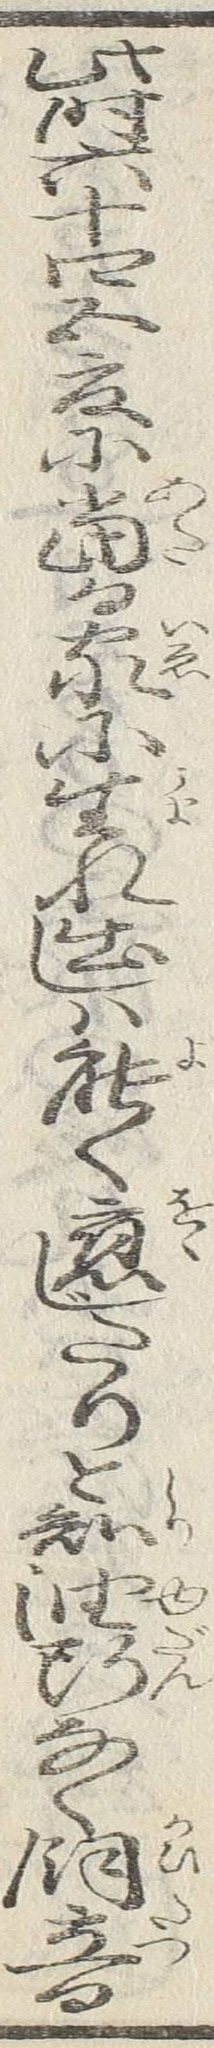此時六十四五度に当る家に生れ出しは能く応じたりと知油断なく飼立る
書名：養蠶實驗録
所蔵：東京大学農学生命科学図書館 国文学研究資料館
